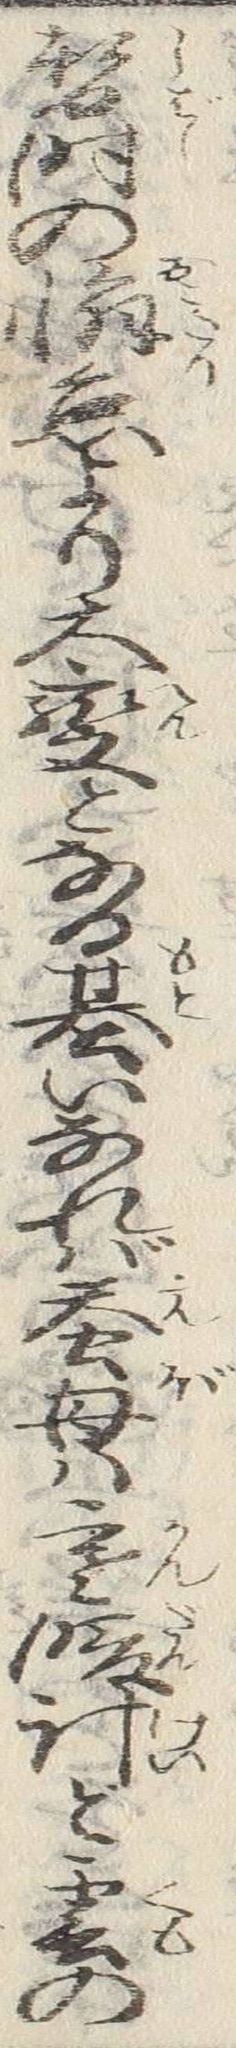暫時の惰怠より大變となる基いなれば蚕母は寒暖計と雲の
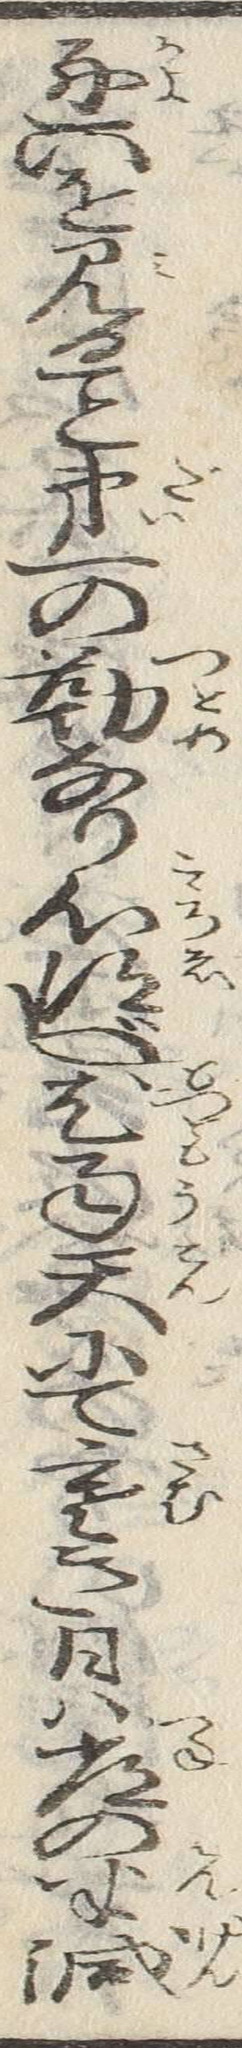通いを見ること第一の勤なり心得べし尤雨天にて寒き日は常の半減

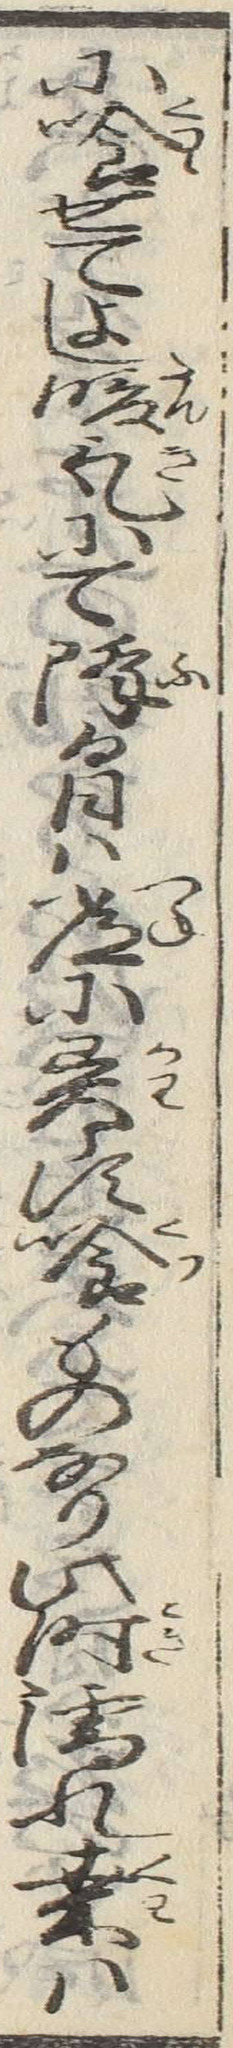に喰せてよし暖気にて降る日は常に異らす喰ものなり此時濡れ桑は
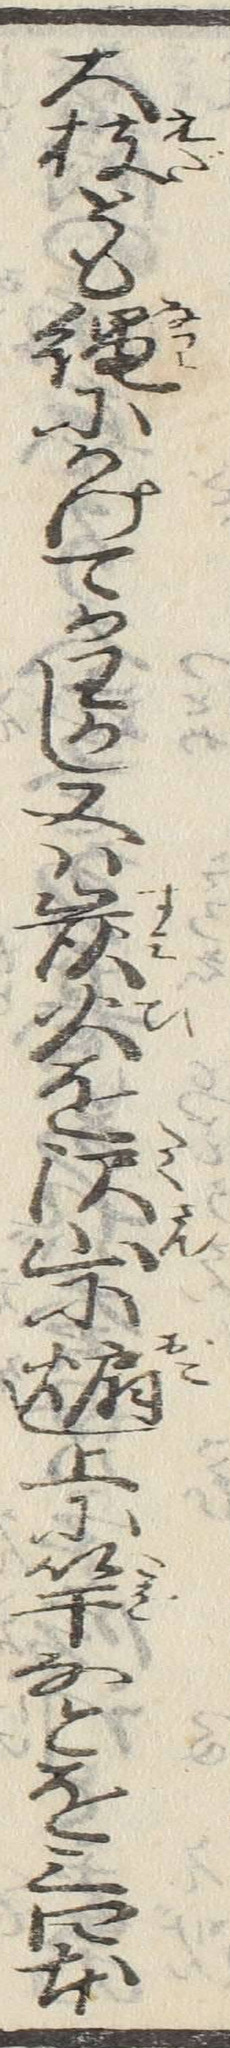大枝とも縄にかけてかわかし又は炭火を沢山に煽し上に竿なとを三四本
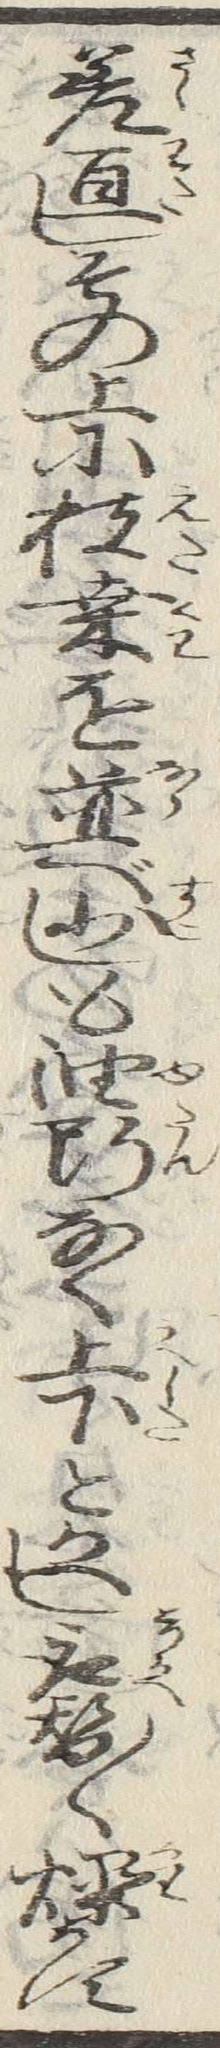差亘しその上に枝桑を並べ少しも油断なく上下とかへし取替〳〵燥かす
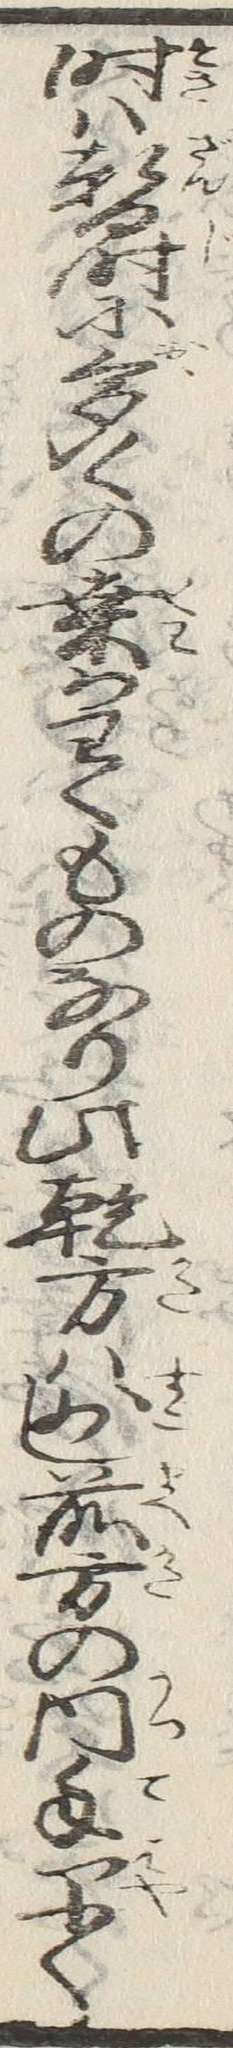時は暫時に多くの桑かわくものなり此乾方は少し前方の内手早く
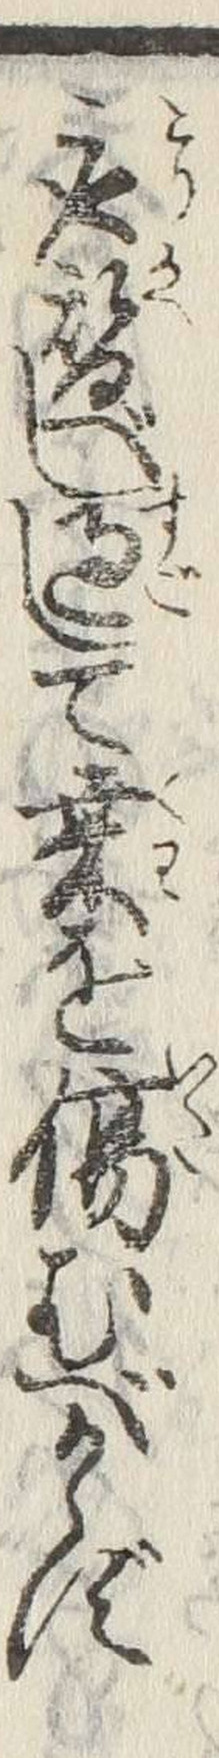取替るべし過して桑を傷むべからず
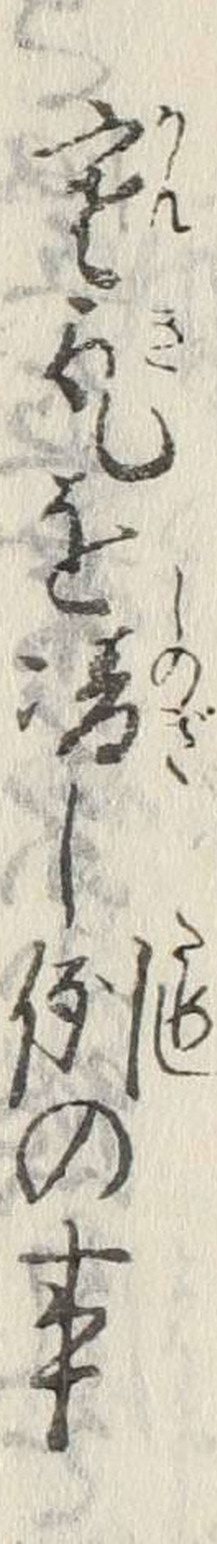寒気を凌し例の事
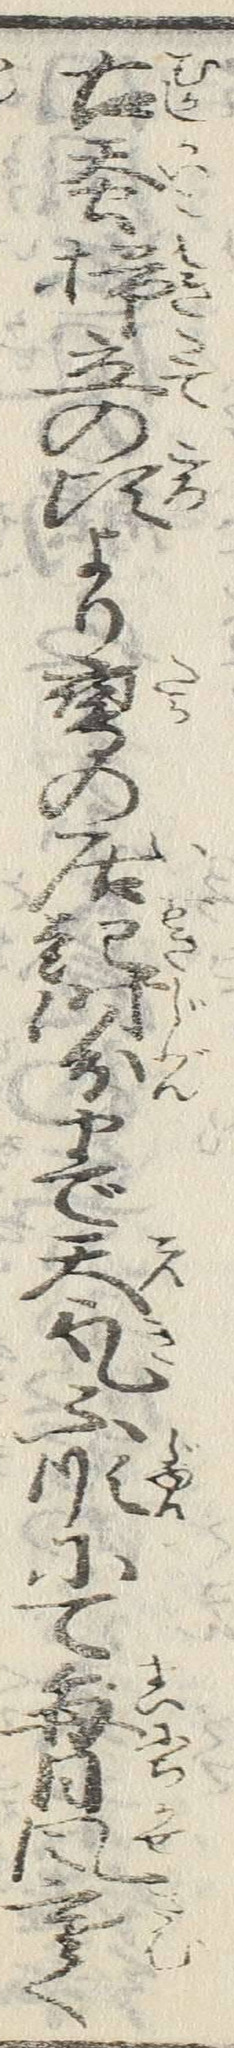古蚕掃立の頃より鷹の居起時分まで天気ふ順にて毎日風寒く
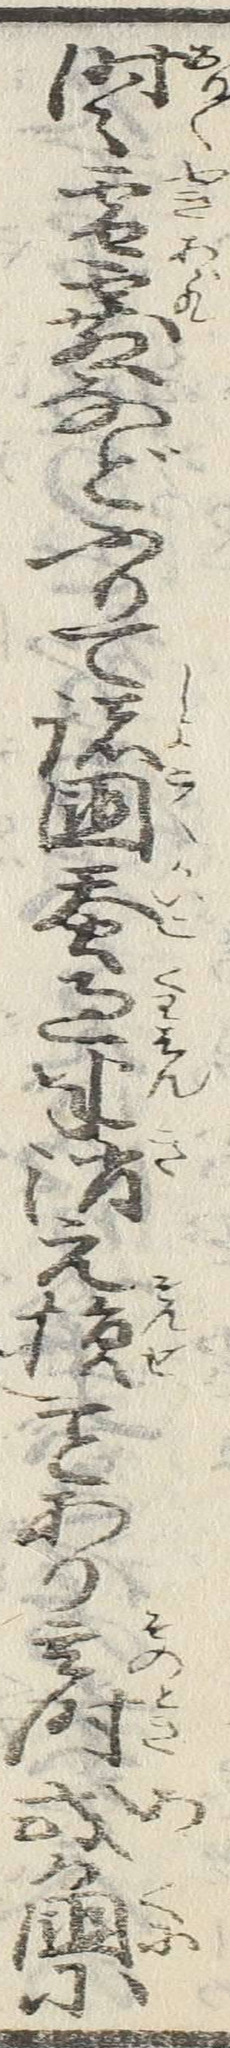時々雪霰などふりて諸国蚕過半消え損しことあり其時或る國に
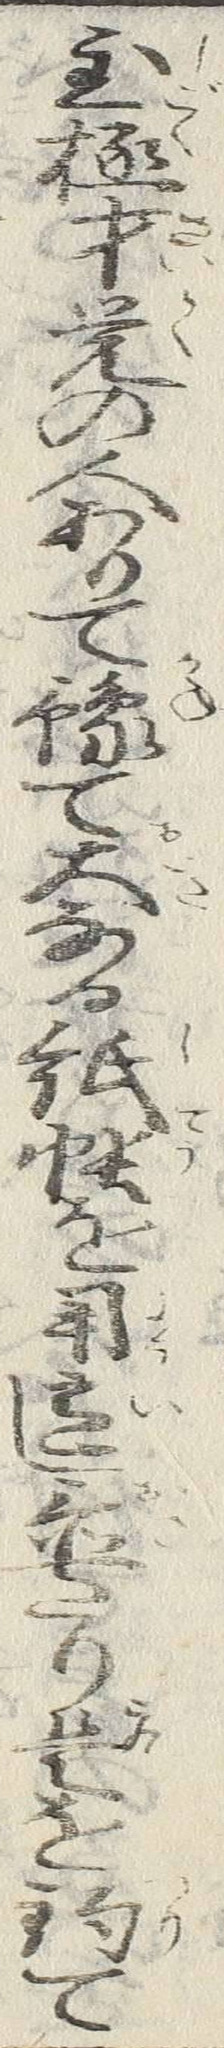至極才覚の人ありて豫て大なる紙帳を用意し置たり是を釣て
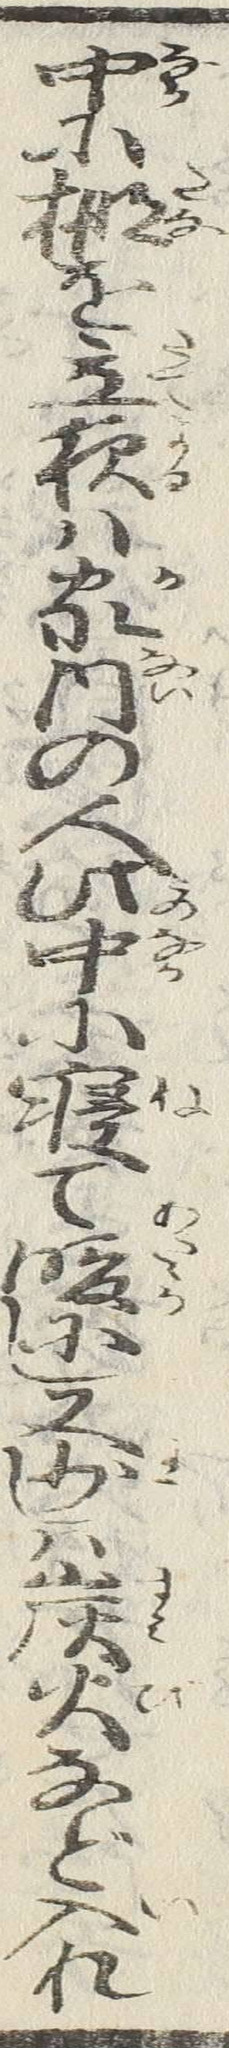中に棚を立夜は家内の人此中に寝て暖にし又少しは炭火など入れ
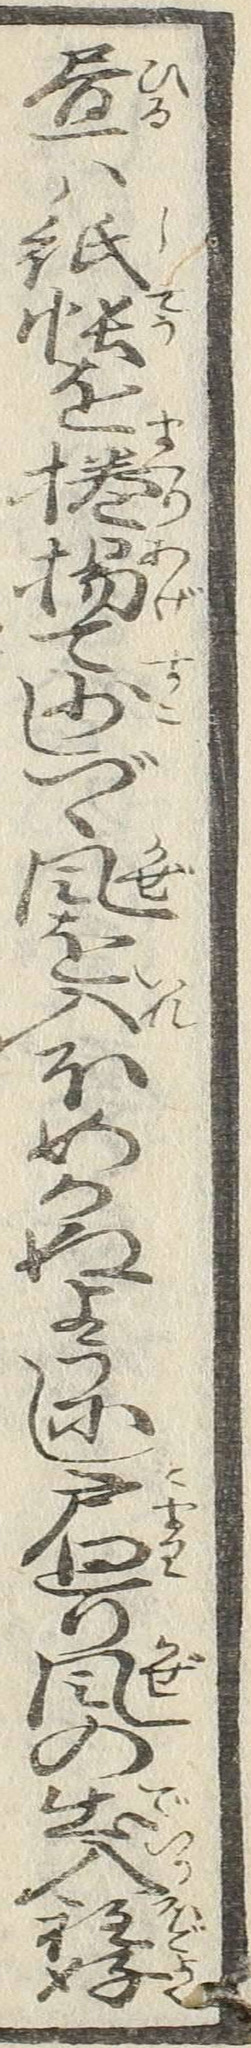昼は紙帳を捲揚て少しづゝ風を入ほめかぬようにし戸廻り風の出入程好
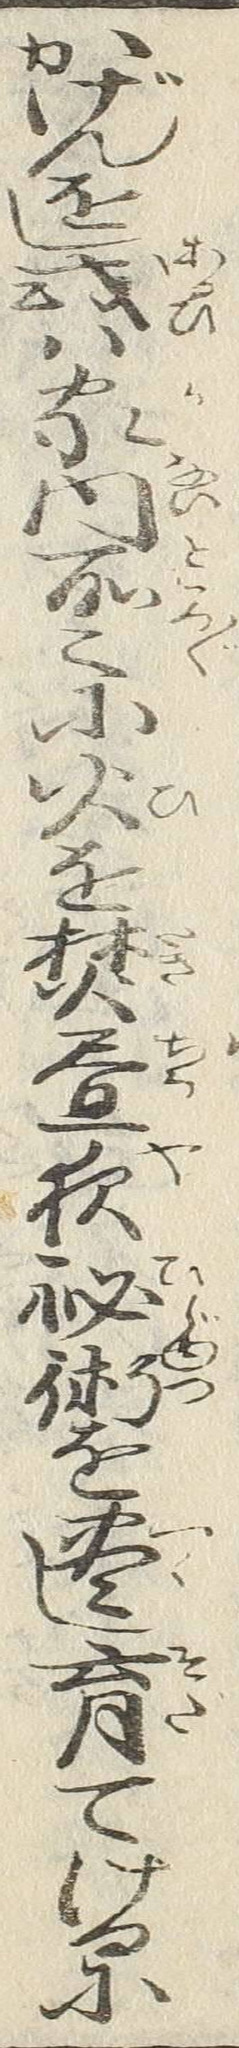かげんをし或は家内所々に火を焚昼夜秘術を盡し育てけるに
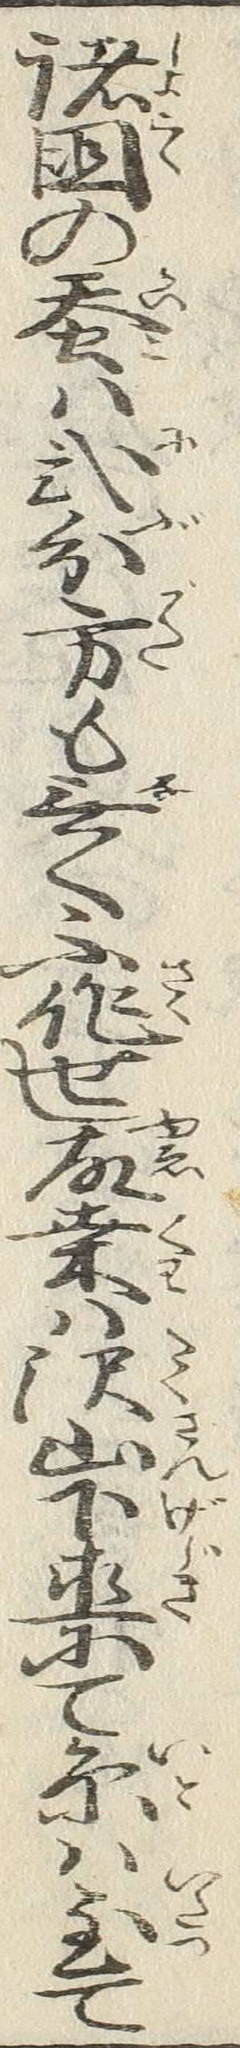諸国の蚕は弐分方も無くふ作せし故桑は沢山下直にて糸は至て
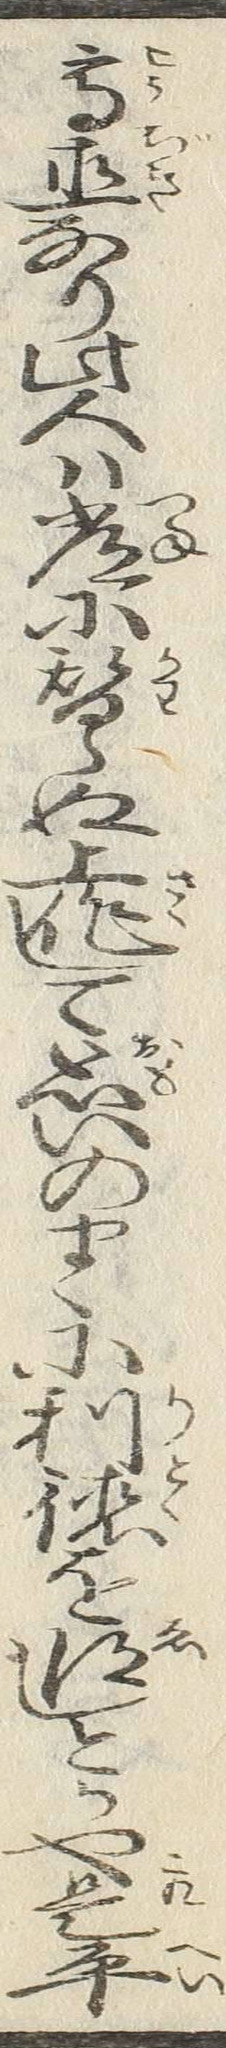高直なり此人は常に替らぬ上作して思いのまゝに利徳を得しとかや是平
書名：養蠶實驗録
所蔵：東京大学農学生命科学図書館 国文学研究資料館
